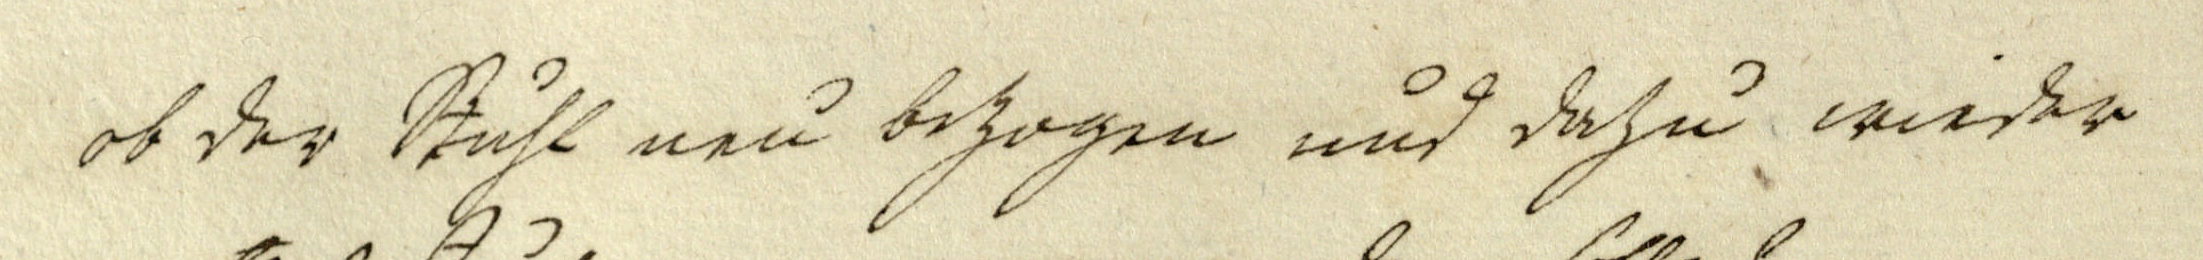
ob der Stuhl neu bezogen und dazu wieder
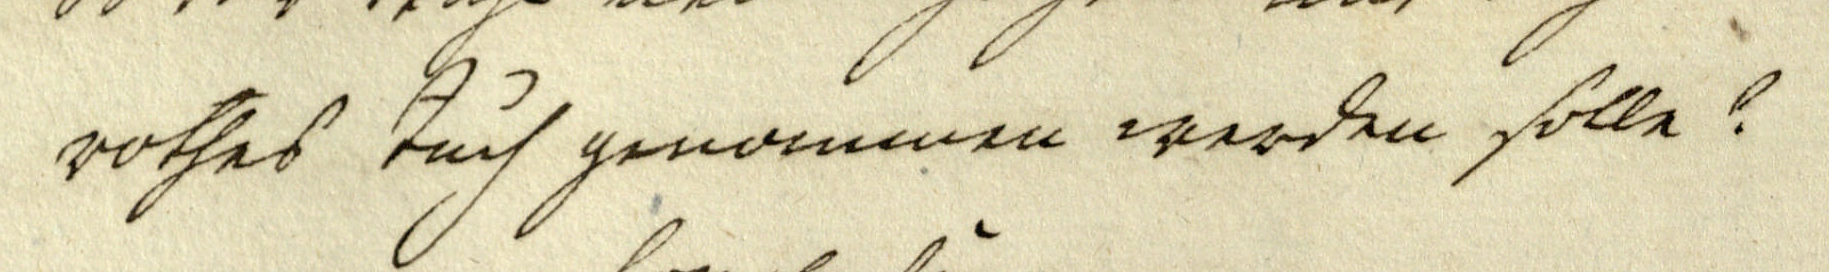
rothes Tuch genommen werden solle?
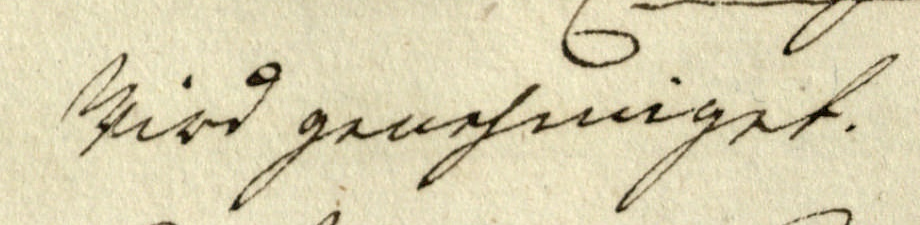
Wird genehmiget.
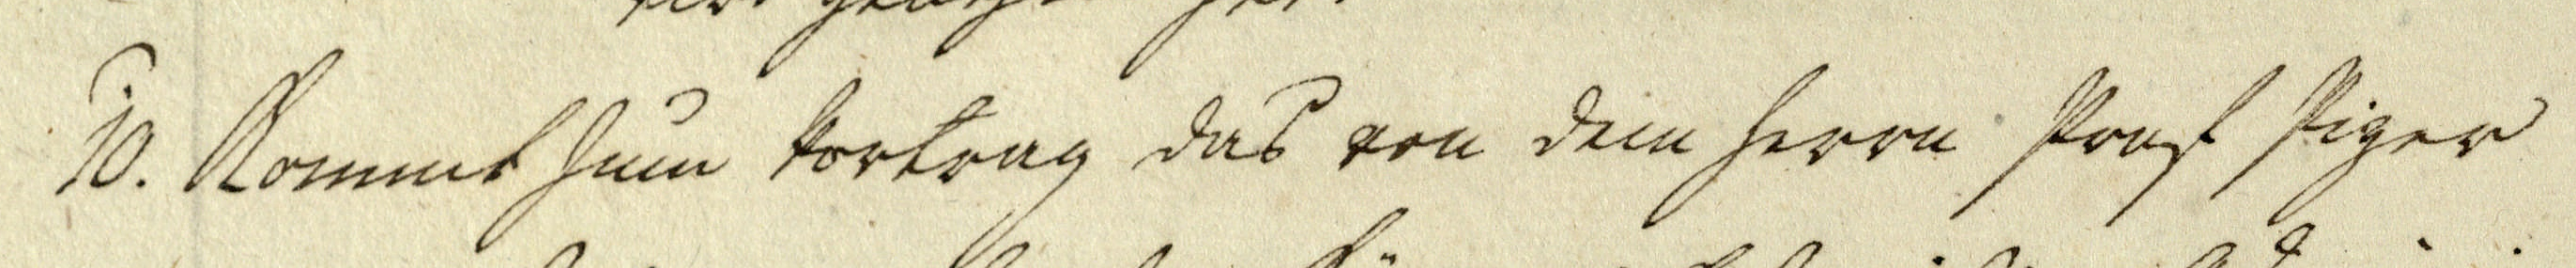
10. Kommt zum Vortrag das von dem Herrn Prof. Piper
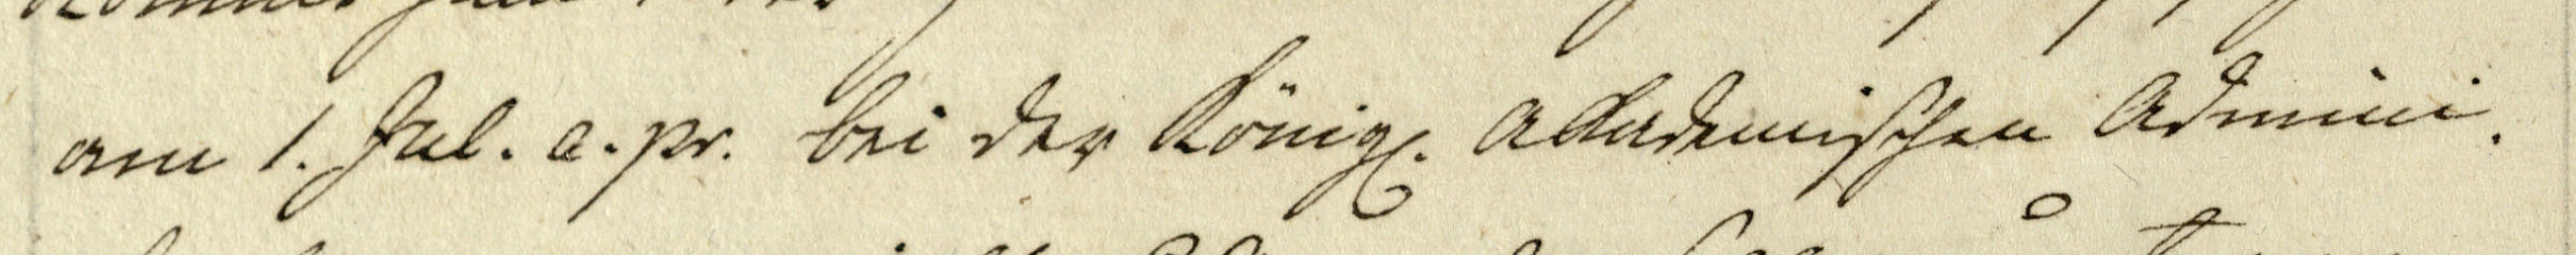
am 1. Jul. a. pr. bei der Königl. Akademischen Admini¬
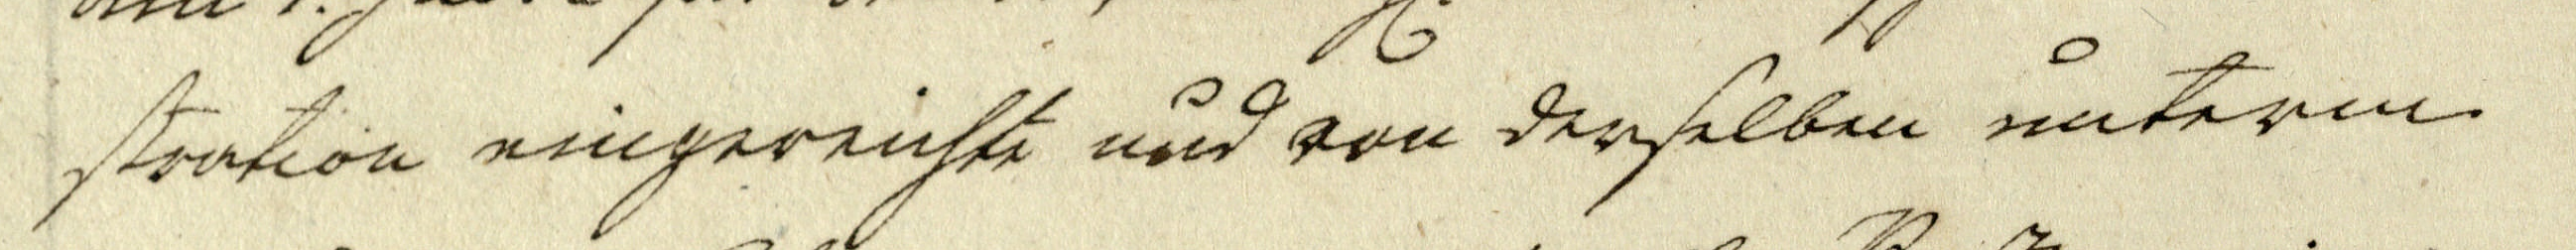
stration eingereichte und von derselben unterm
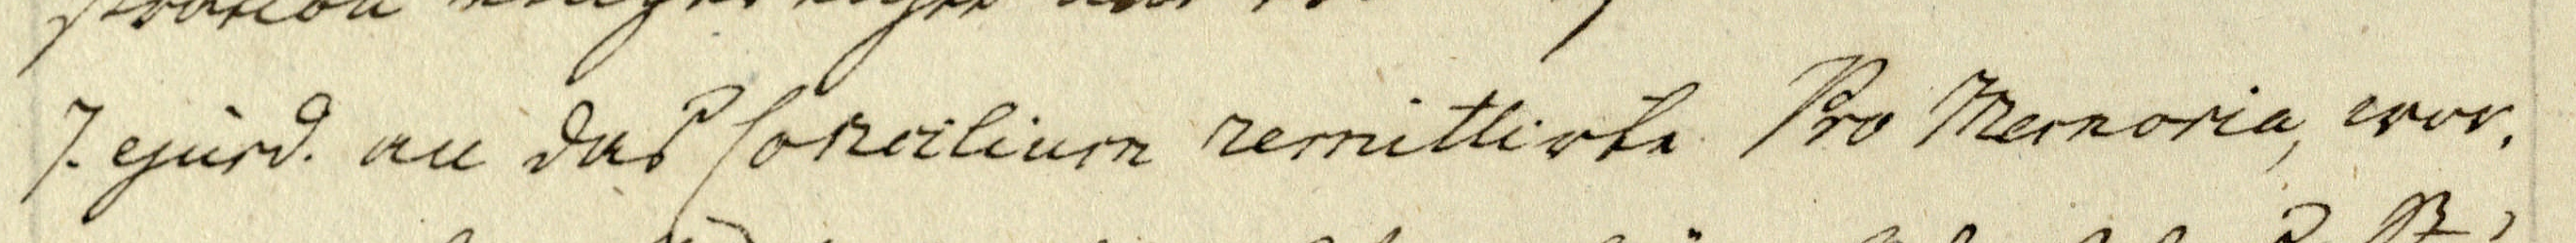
7. ejusd. an das Concilium remittirte Pro Memoria, wor¬
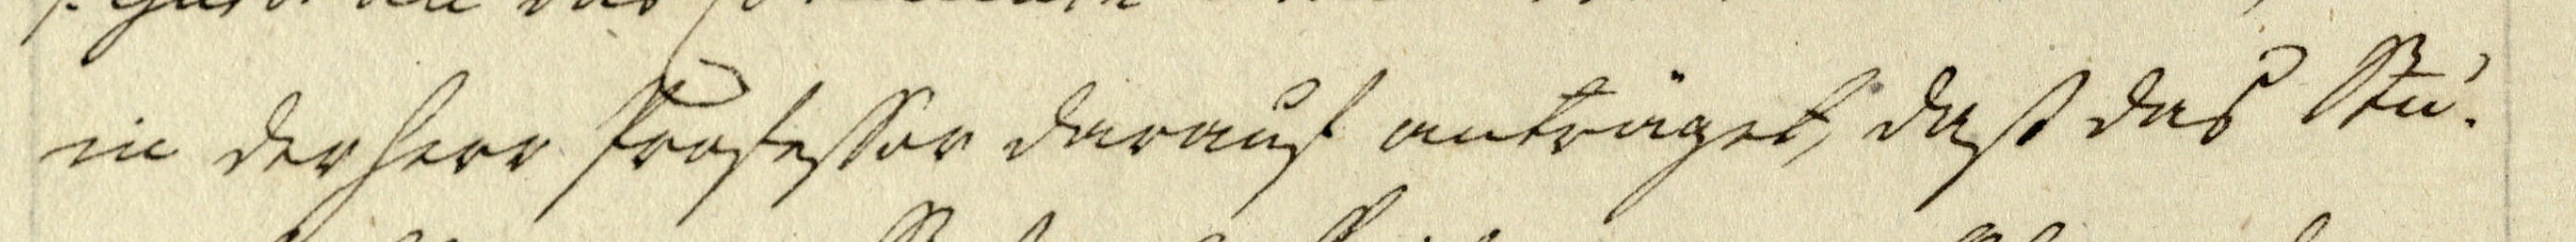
in der Herr Professor darauf anträget, daß das Stu¬
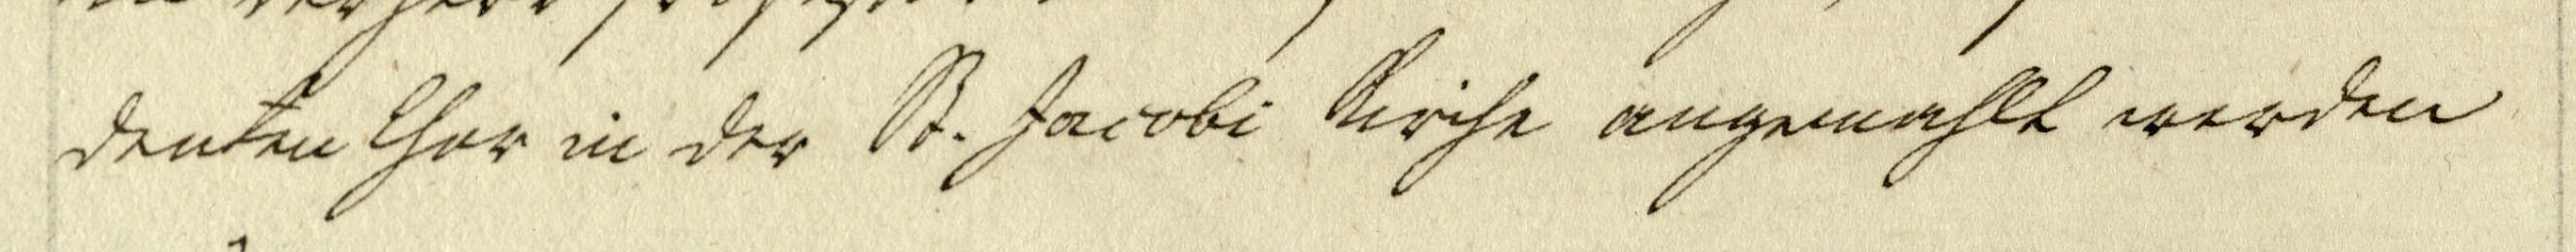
denten Chor in der St. Jacobi Kirche angemahlt werden
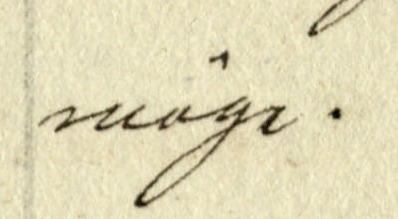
möge.
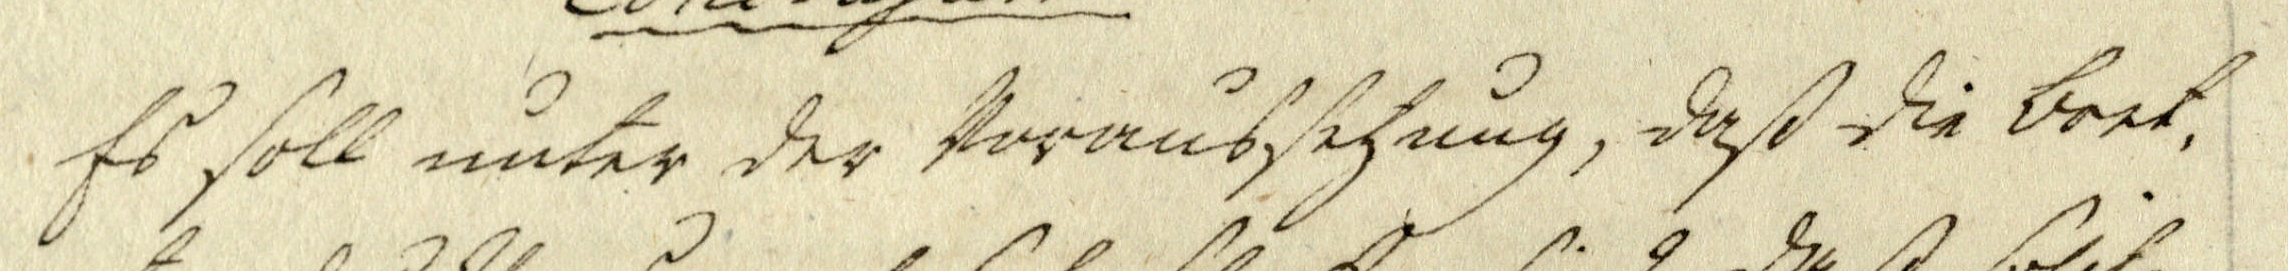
Es soll unter der Voraussetzung, daß die Bret¬
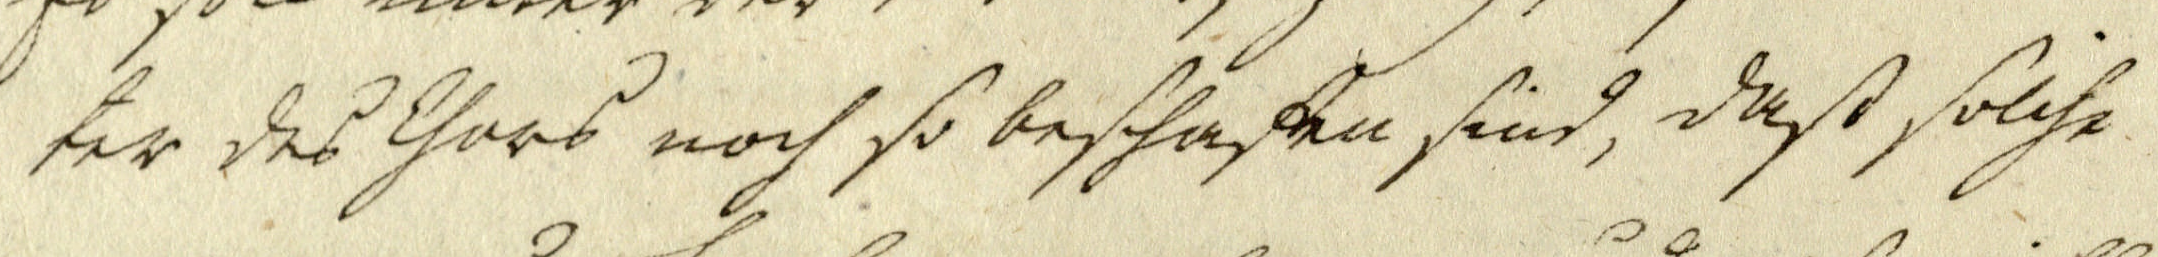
ter des Chors noch so beschaffen sind, daß solche
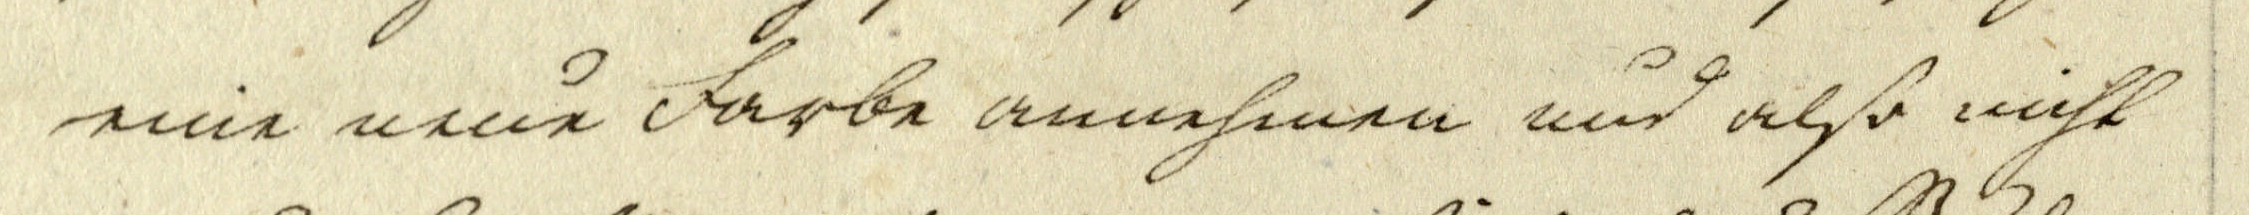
eine neue Farbe annehmen und also nicht
